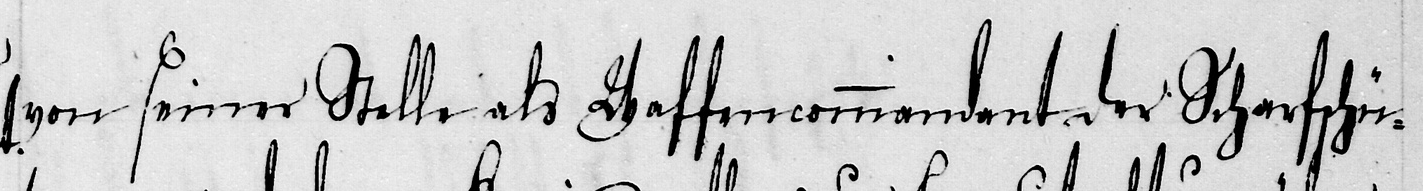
von seiner Stelle als Waffencommandant der Scharfschü¬
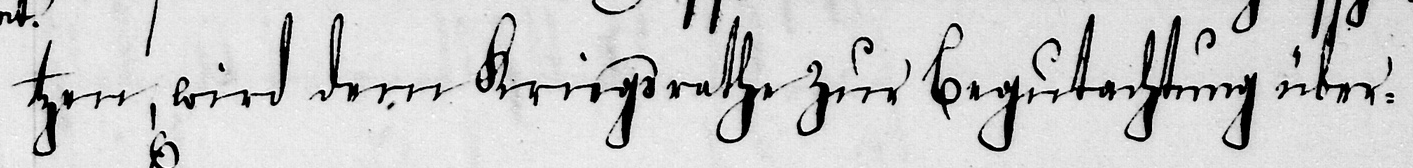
tzen, wird dem Kriegsrathe zur Begutachtung über¬
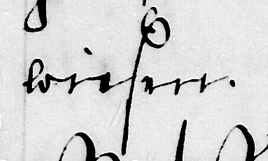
wiesen.
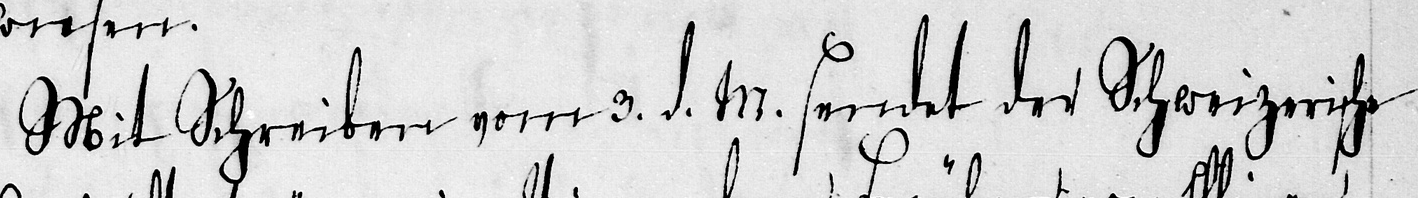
Mit Schreiben vom 3. d. M. sendet der Schweizerische
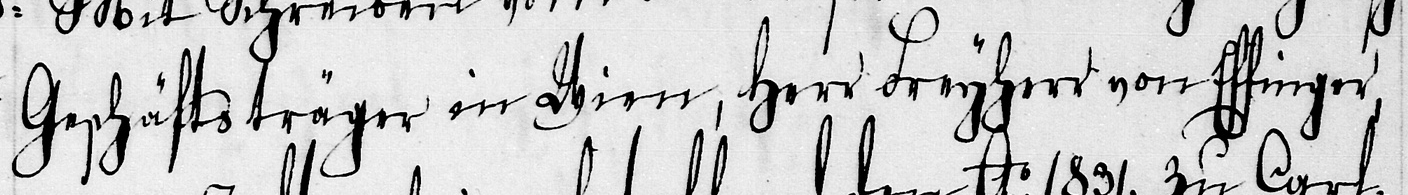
Geschäftsträger in Wien, Herr Freyherr von Effinger,
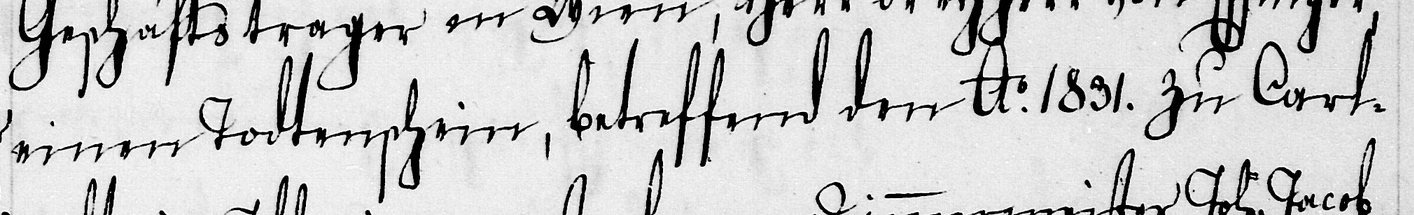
einen Todtenschein, betreffend den Ao. 1831. zu Carl¬
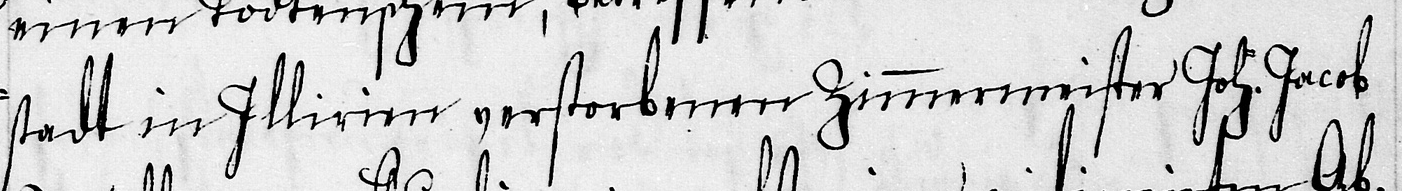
stadt in Illilrien verstorbenen Zimmermeister Joh. Jacob
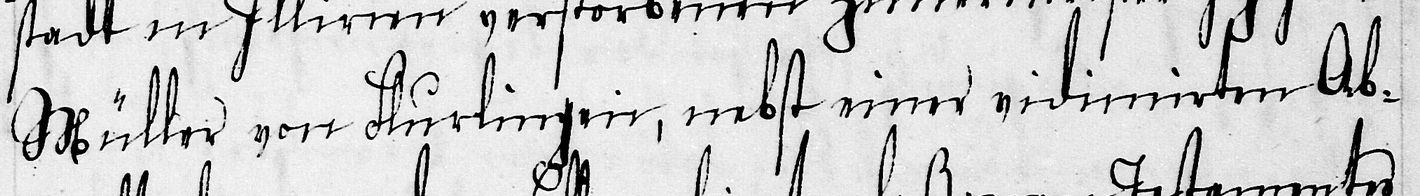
Müller von Flurlingen, nebst einer vidimirten Abs¬
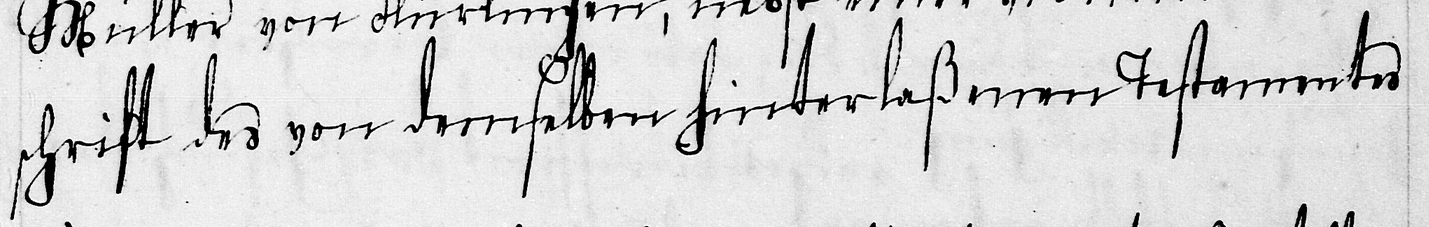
chrift des von demselben hinterlaßenen Testamentes
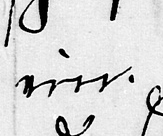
ein.
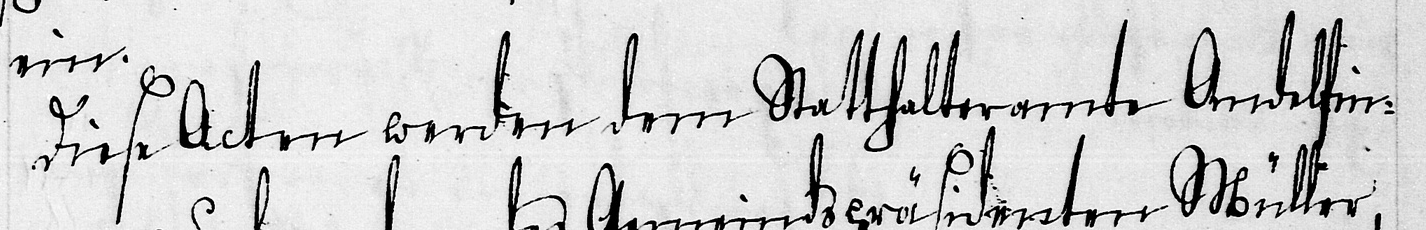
Diese Acten werden dem Statthalteramte Andelfin¬
